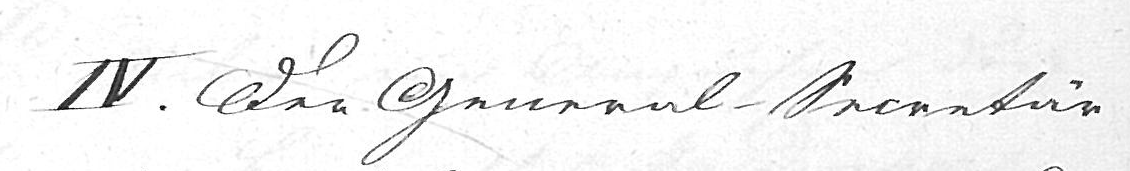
IV. Der General-Secretär
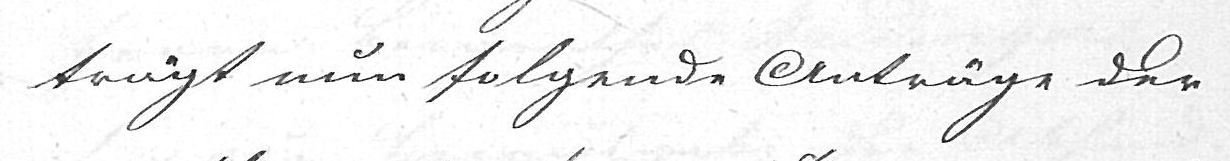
trägt nun folgende Anträge der
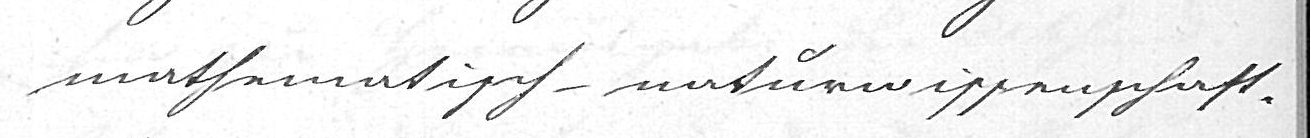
mathematisch-naturwissenschaft-
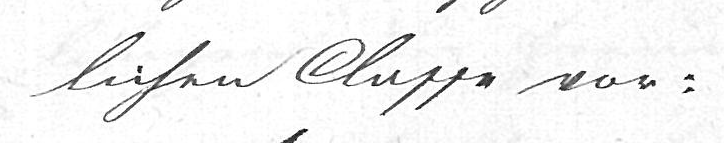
lichen Classe vor:
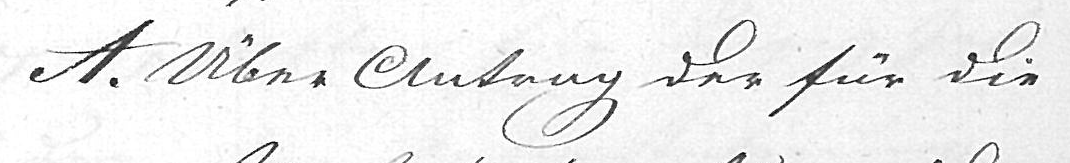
A. Über Antrag der für die
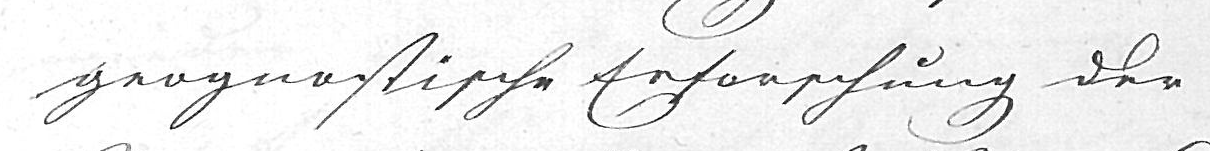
geognostische Erforschung der
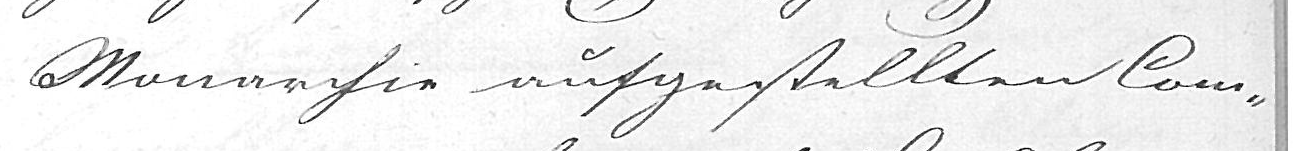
Monarchie aufgestelllen Com-
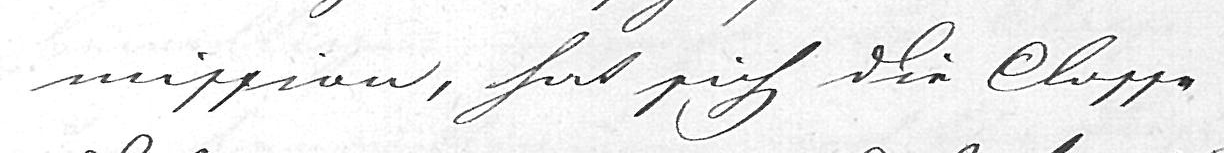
mission, hat sich die Classe
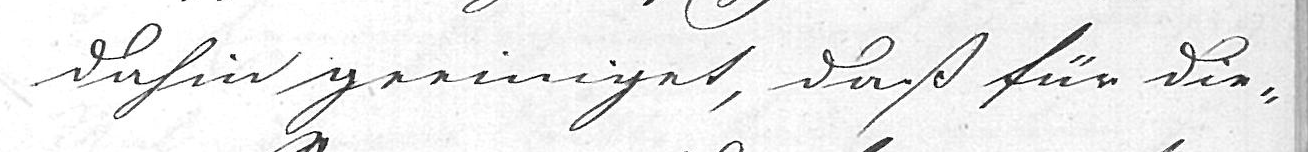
dahin geeiniget daß für die-
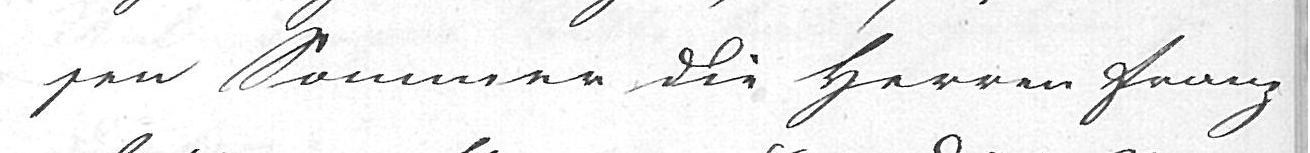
sen Sommer die Herren Franz
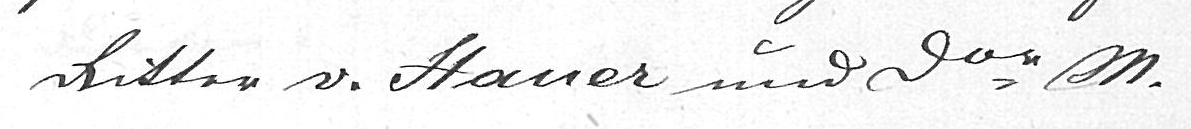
Ritter v. Hauer und Dor M.
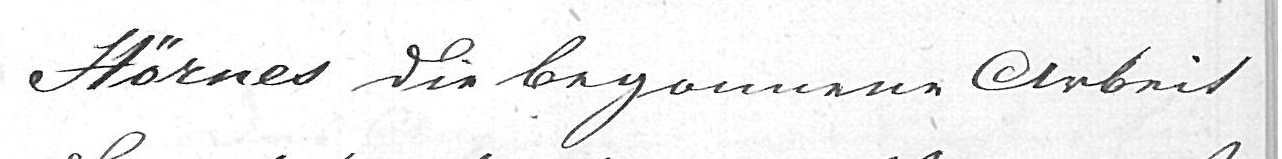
Hörnes die begonnene Arbeit
